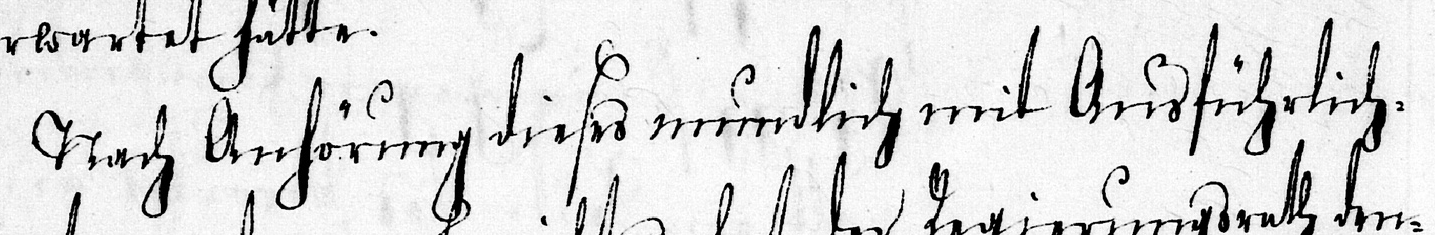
Nach Anhörung dieses mundlich mit Ausführlich¬
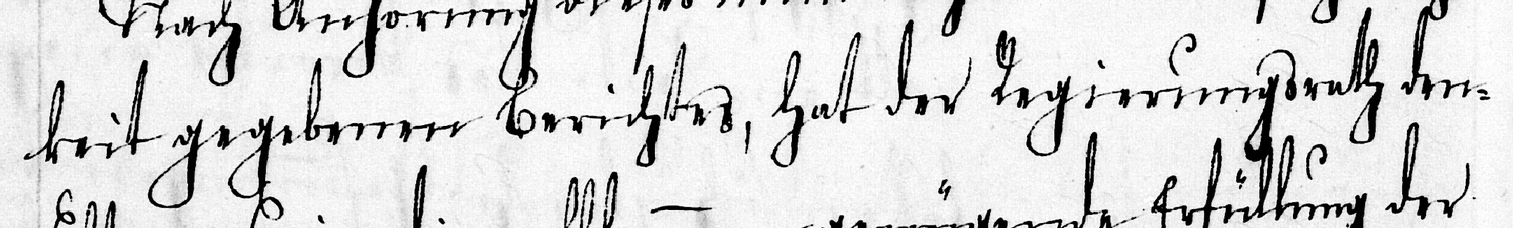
keit gegebenen Berichtes, hat der Regierungsrath den¬
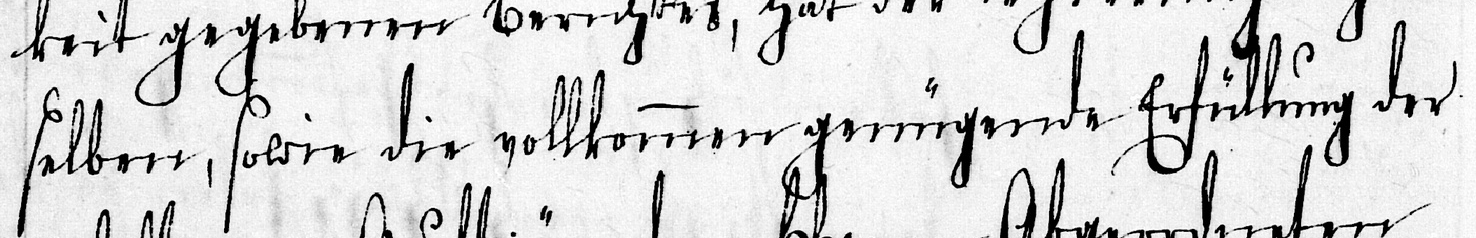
selben, sowie die vollkommen genügende Erfüllung der
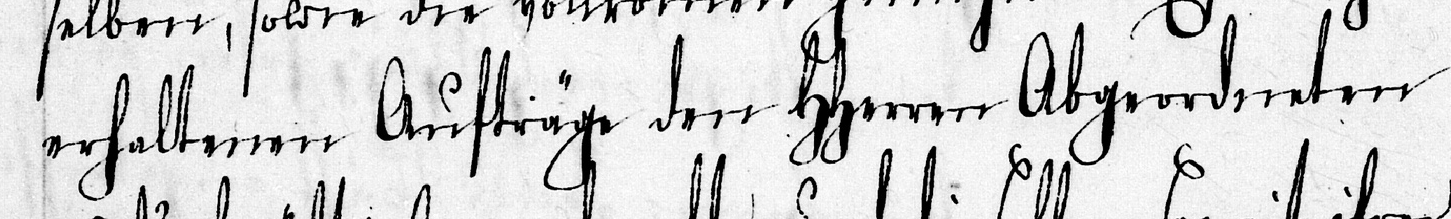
erhaltenen Aufträge den HHerren Abgeordneten
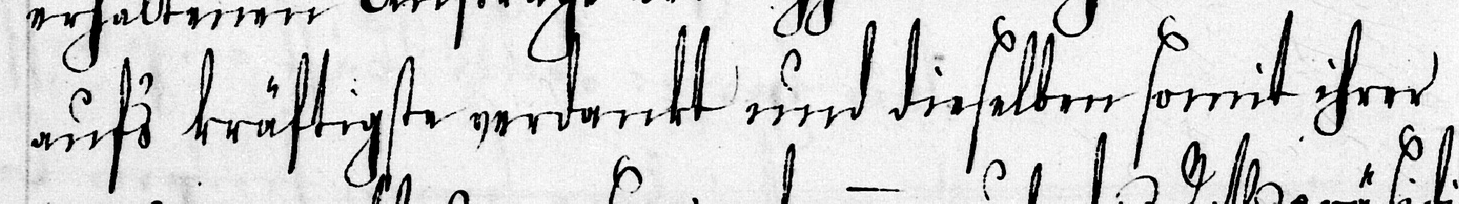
aufs kräftigste verdankt und dieselben somit ihrer
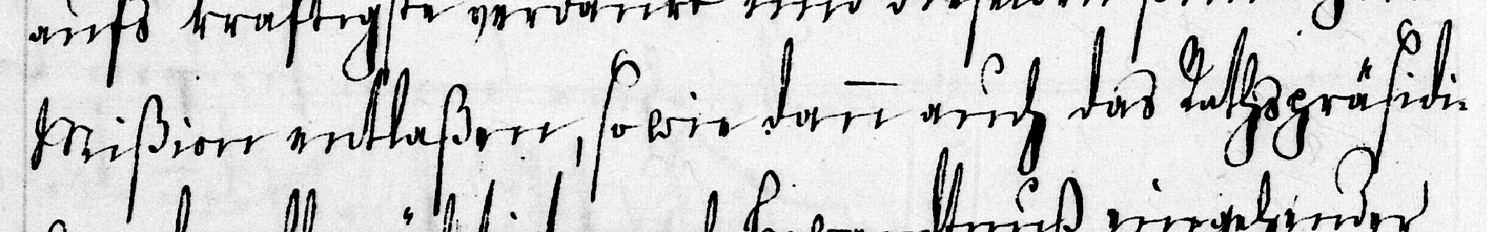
Mißion entlaßen, sowie dann auch das Rathspräsidi¬
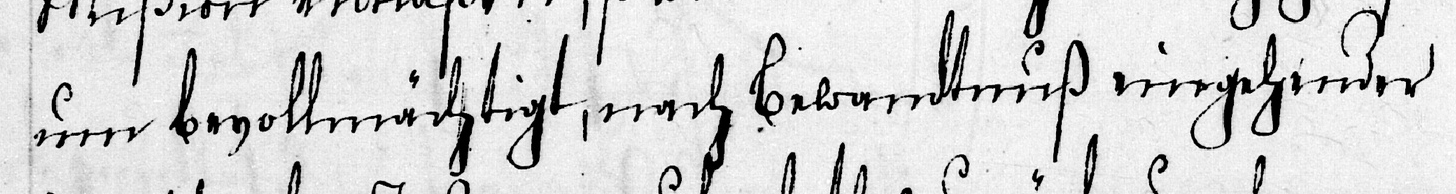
um bevollmächtigt, nach Bewandtnuß eingehender
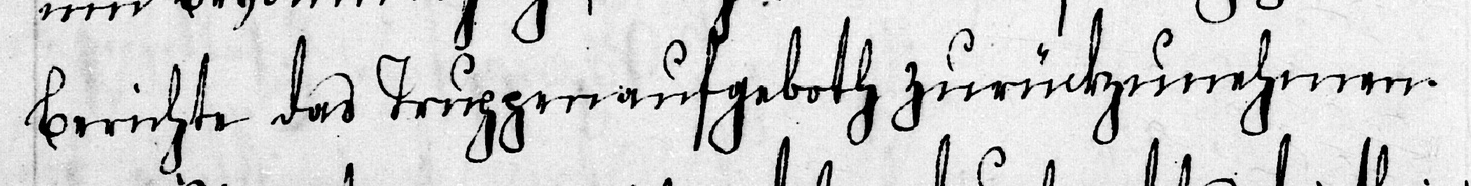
Berichte das Truppenaufgeboth zurückzunehmen.
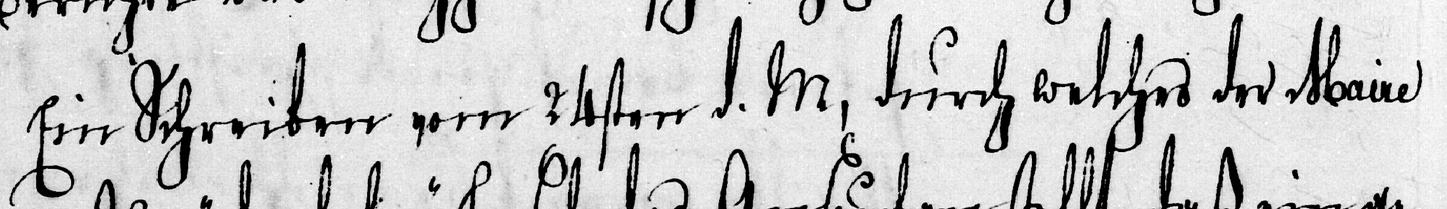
Ein Schreiben vom 24sten d. M., durch welches der Maire
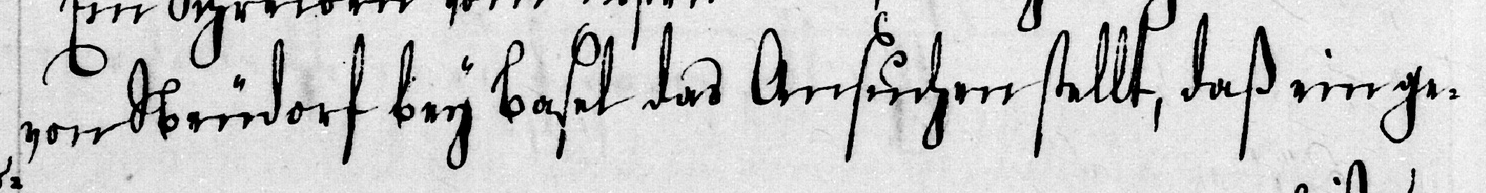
von Neudorf bey Basel das Ansuchen stellt, daß ein ge-
